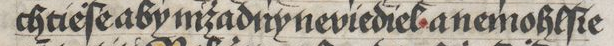chtíeẛe aby niżadny neviediel.a nemohl ſie¬
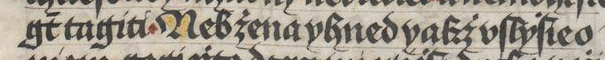ḡt tagiti.Neb żena yhned yakż vſlyẛie o¬
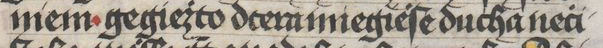níem.gegieżto dcera miegieẛe ducha neċi¬
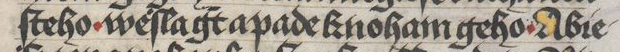ſteho.weẛla ḡt a pade knoham geho.Abíe¬
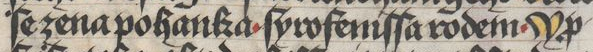ẛe żena pohanka.ſyrofenivſa rodem.Y ꝓ¬
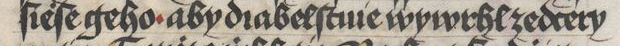ſieẛe geho.aby diabelſtuíe wywrhl zedcery
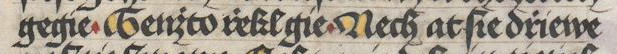gegíe.Genżto ṙekl gíe.Nech at ſie dṙiewe
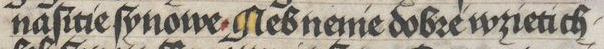naſitíe ſynowe.Neb neníe dobré wzíetích
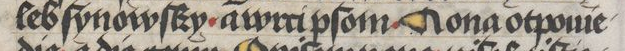leb ſynowſky.a wrci pſom.A ona otpouíe¬
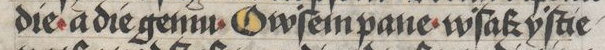die.a díe gemu.Owẛem pane.wẛak y ẛtie¬
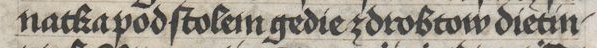natka pod ſtolem gedie z drobtow díetín¬
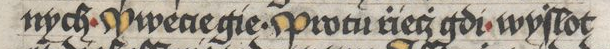ných.Ywecie gíe.Protu ṙiecż gdi.wyẛlot
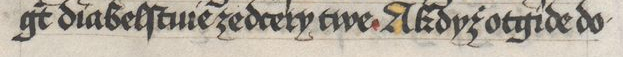ḡt diabelſtuíe ze dcery twe.A kdyż otgíde do¬
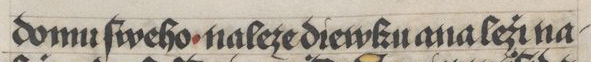domu ſweho.naleze diewku ana leżi na¬
